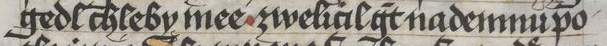gedl chleby mee.zweliċil ḡt nademnu po¬
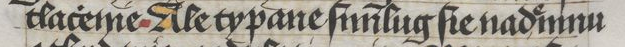tlaċeníe.Ale ty pane ſmilug ſie nademnu
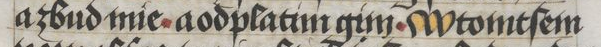a zbud mie.a odplatim gim.Wtomtſem
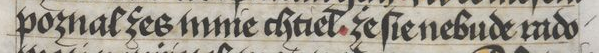poznal żes mnie chtiel.że ſie nebude rado¬
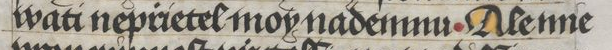wati nepṙíetel moy nademnu.Ale mie
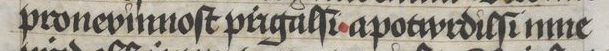pronevinnoſt pṙigalſi.a potwrdilſi mne
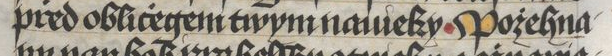pṙed obliċegem twym nauieky.Pożehna¬
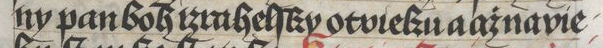ny pan boh izrahelſky otvieku a aż navie¬
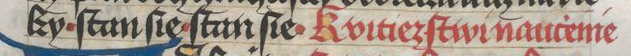ky.ſtan ſie.ſtan ſie.Kvitiezſtwí nauċeníe
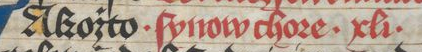Akožto.ſynow chore. xli.
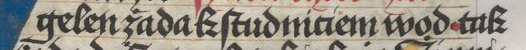gelen žada kſtudnícíem wod.tak
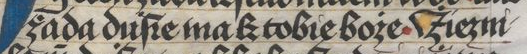žada duẛie ma k tobie boże.Žíezni¬
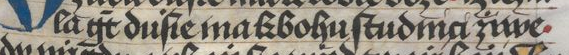la ḡt duẛie ma kbohu ſtudnici żiwe.
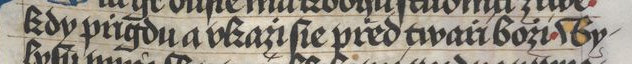kdy pṙigdu a vkażiſie pṙed twaṙí bożí.By¬
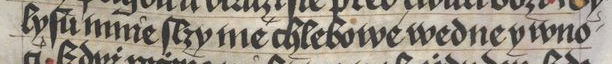lyſu mnie ſlzy mé chlebowé wedne y wno¬
